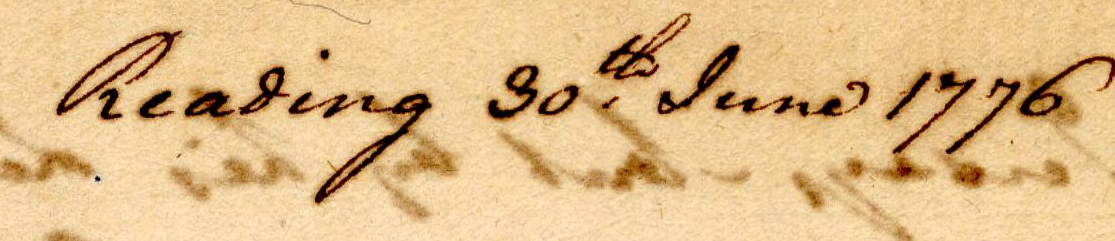Reading 30^th June 1776
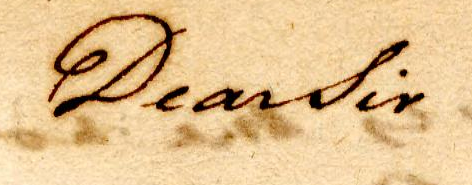Dear Sir
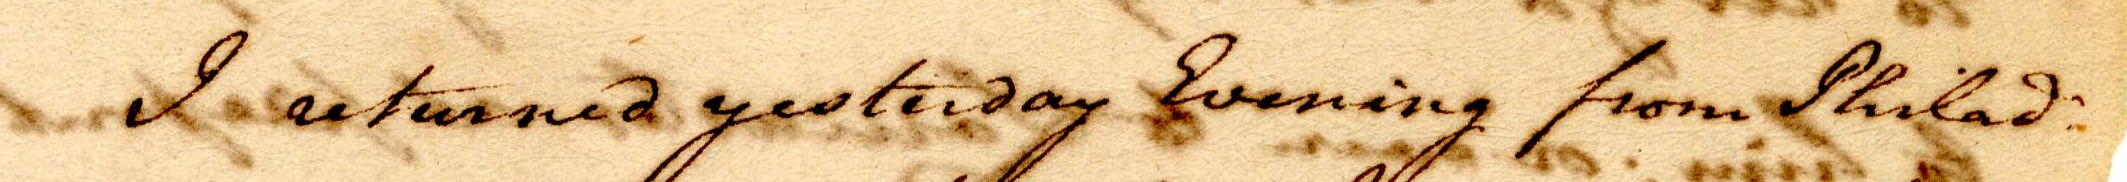I returned yesterday Evening from Philad^a
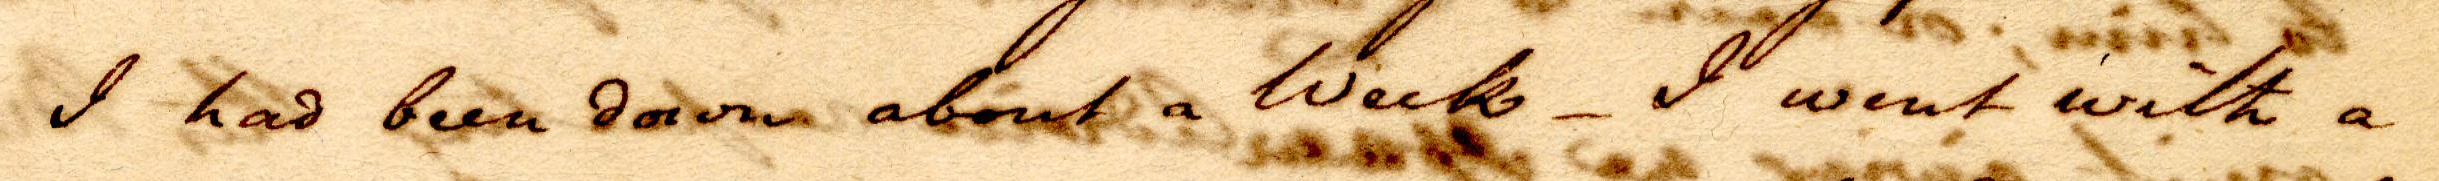I had been down about a Week. I went with a
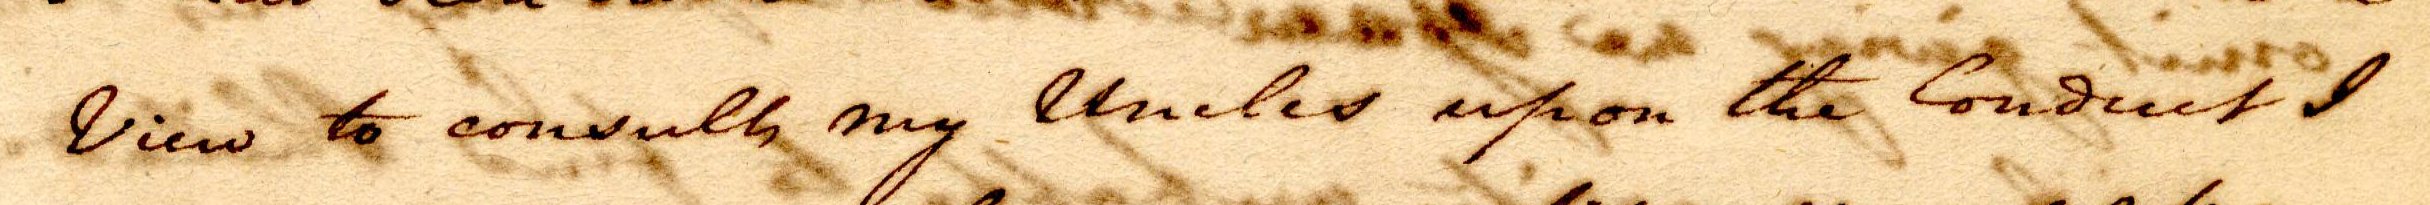View to consult my Uncles upon the Conduct I
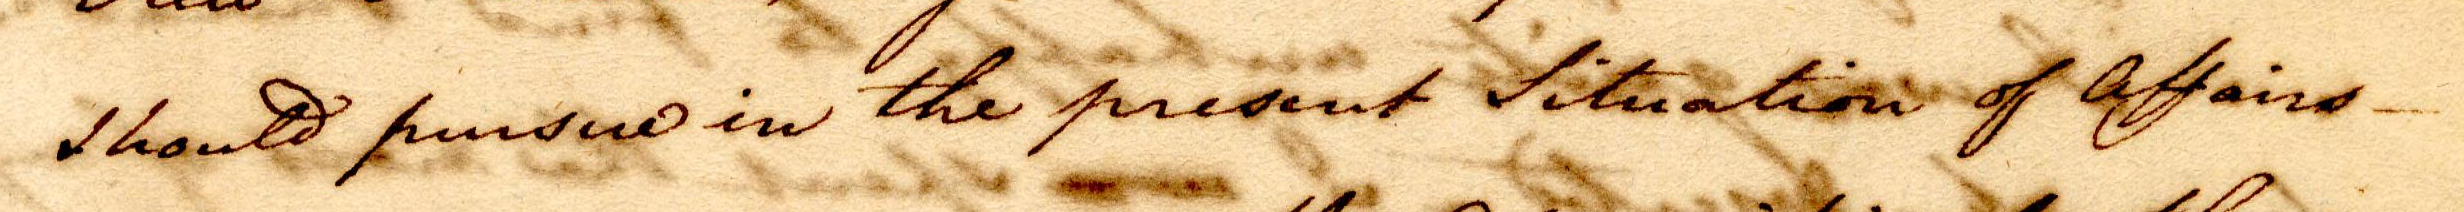should pursue in the present Situation of Affairs.
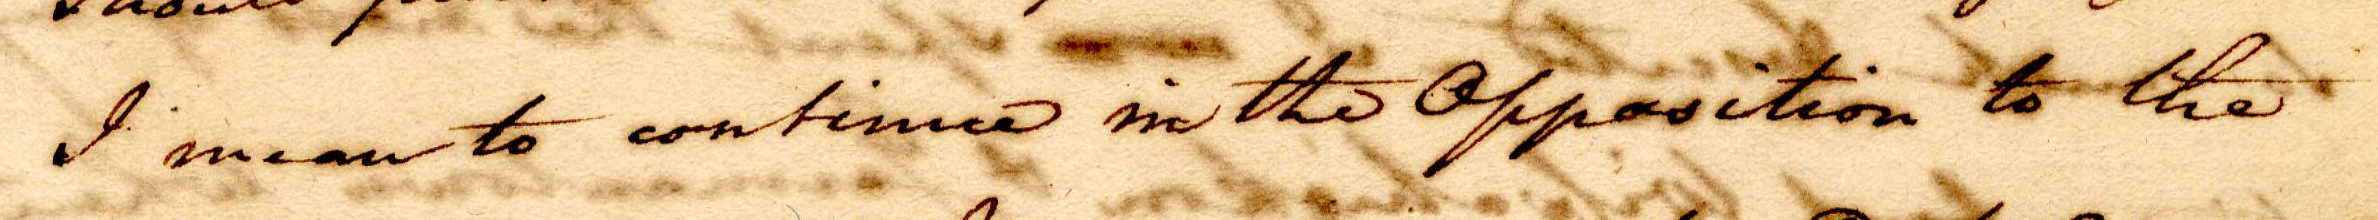I mean to continue in the Opposition to the
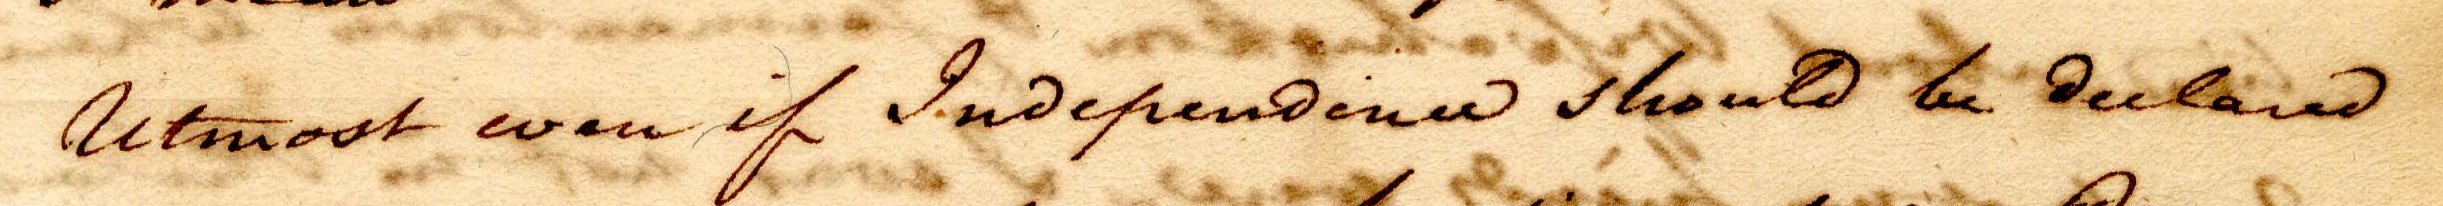Utmost even if Independence should be declared
